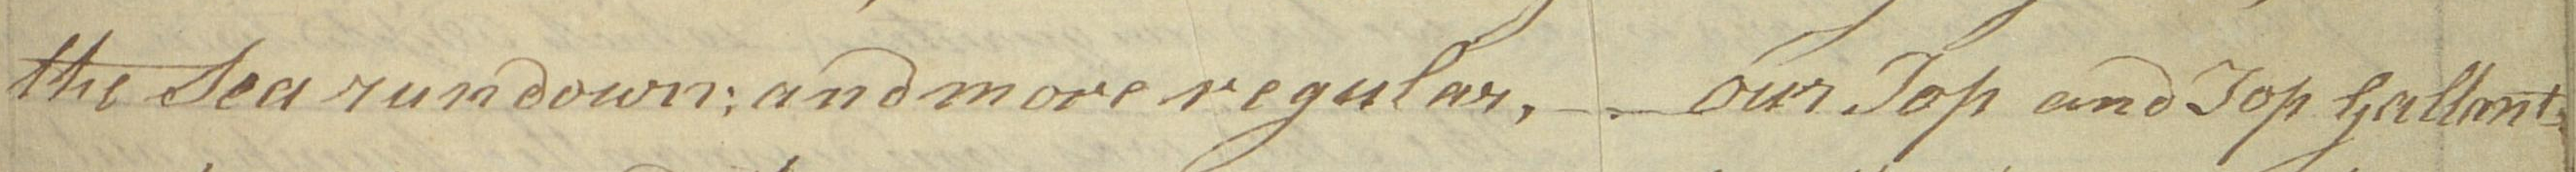the Sea rundown; and more regular, Our Top and Top Gallant
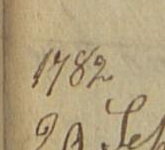1782
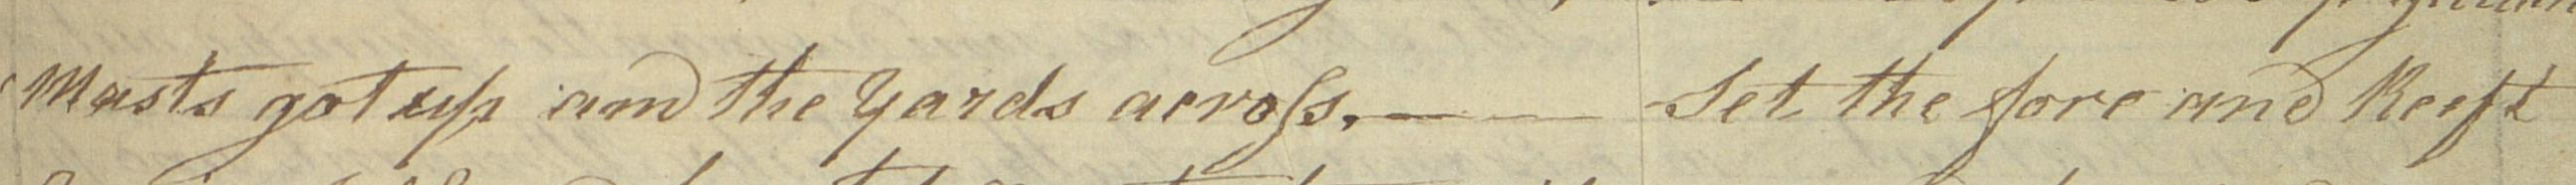Masts got up and the Yards across, Set the fore and Reeft
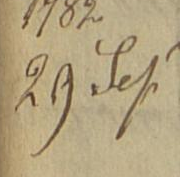29 Sep^r
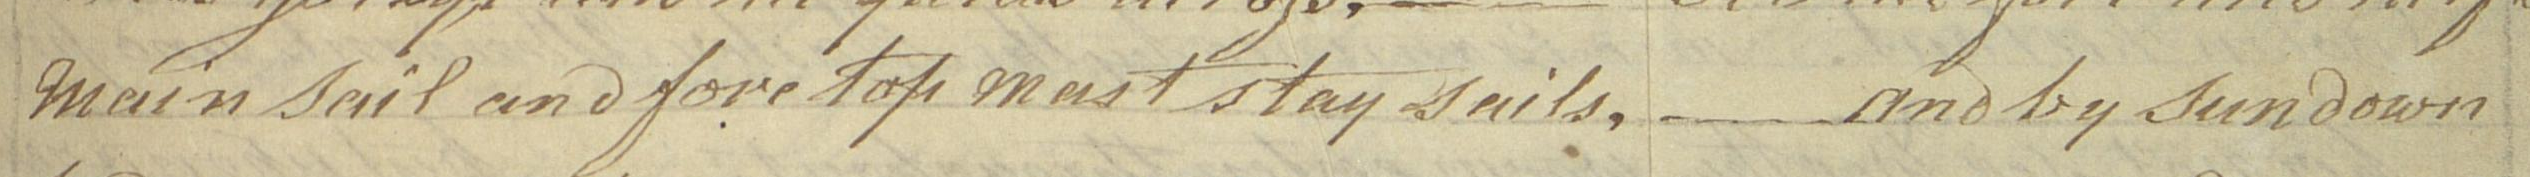Main sail and fore top mast stay Sails, And by sundown
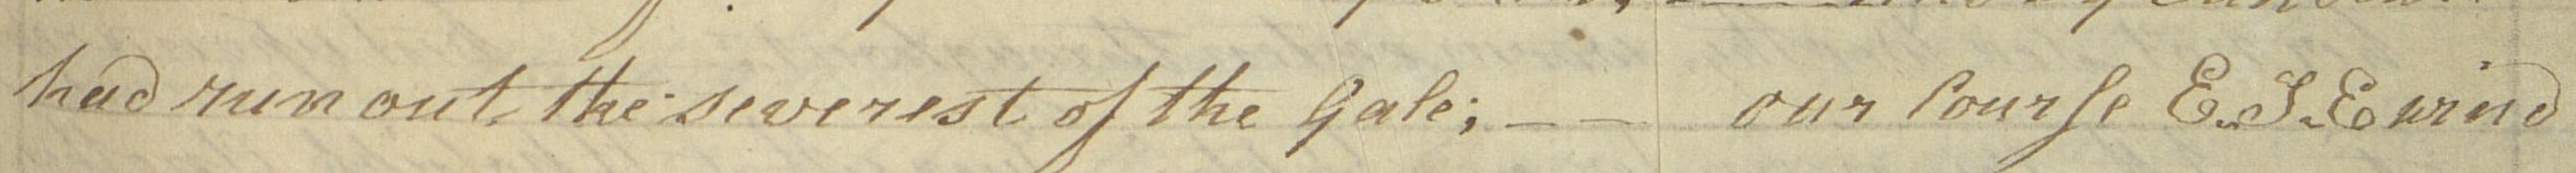had run out the severest of the Gale; our Course E.S.E. wind
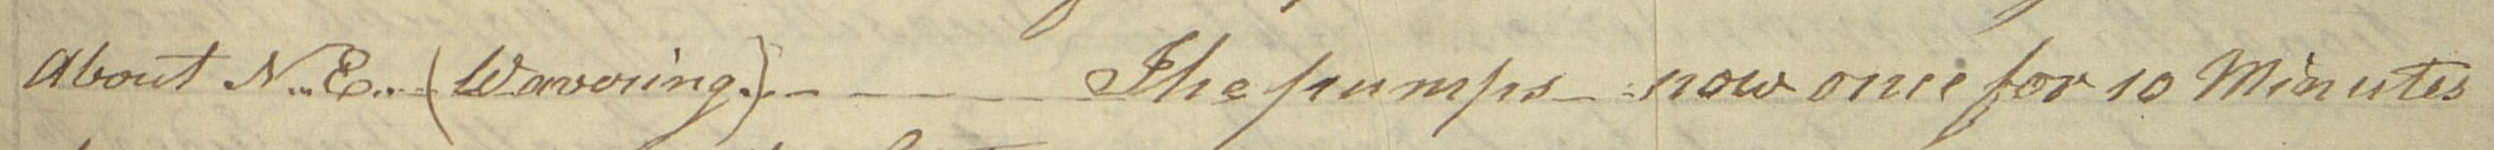About N.E. (Wavering.) The pumps now once for 10 Minutes
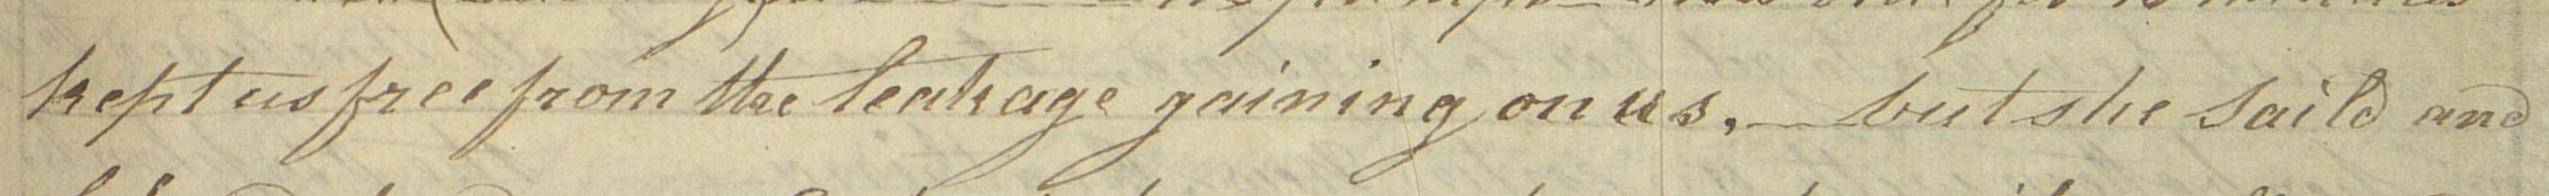kept us free from the leakage gaining on us, but she Saild and
